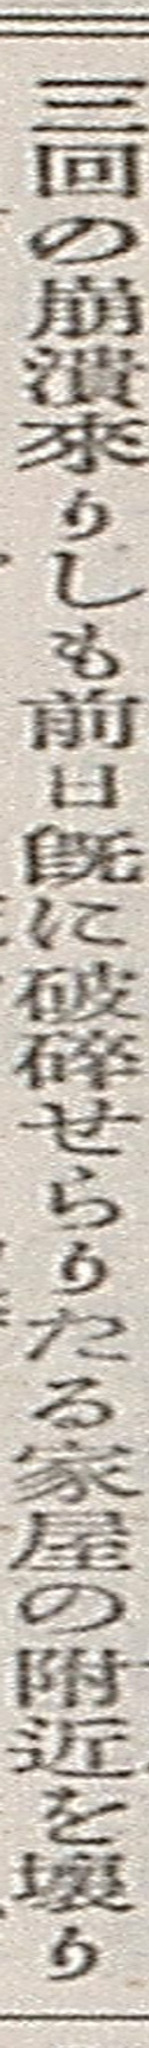三回の崩潰来りしも前日既に破砕せられたる家屋の附近を壊り
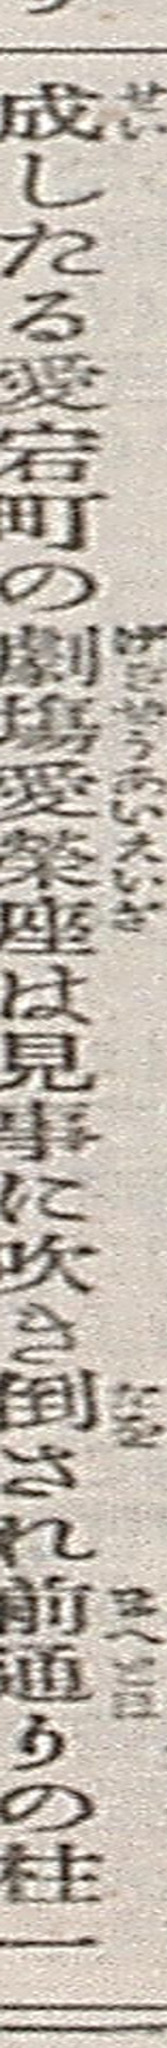成したる愛宕町の劇場愛栄座は見事に吹き倒され前通りの柱一
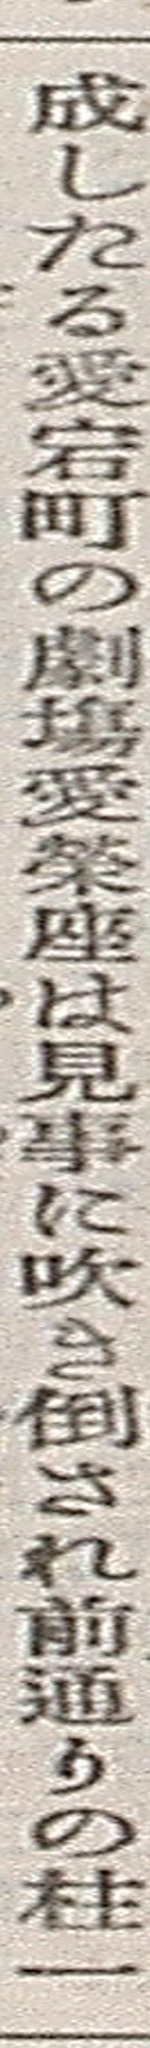成したる愛宕町の劇場愛栄座は見事に吹き倒され前通りの柱一
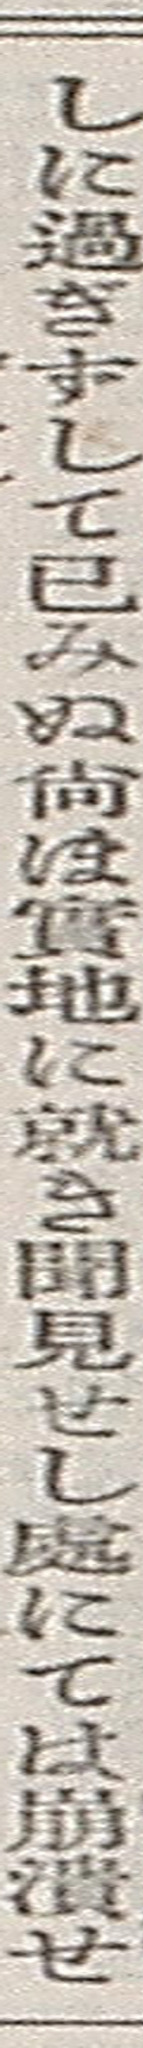しに過ぎずして已みぬ尚ほ実地に就き見聞せし処にては崩潰せ
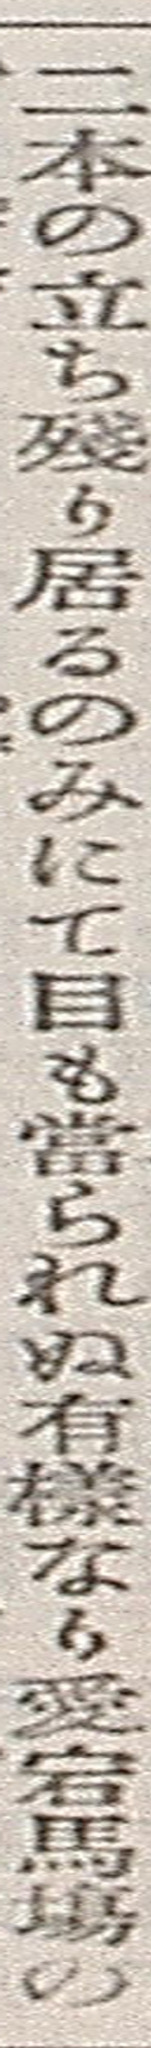二本の立ち残り居りのみにて目も当られぬ有様なり愛宕馬場の
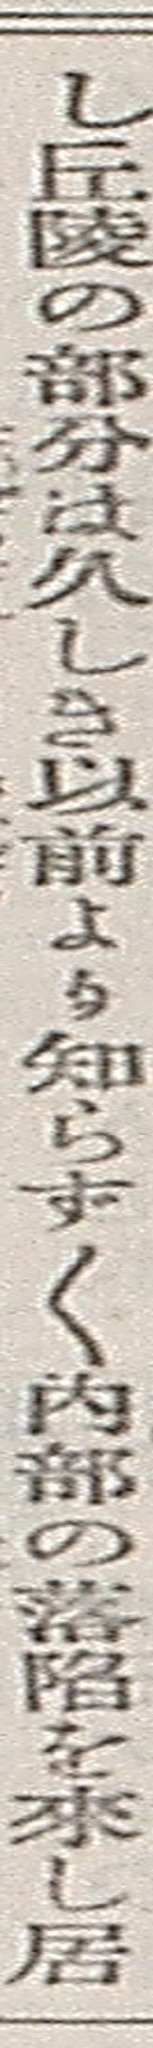し丘陵の部分は久しき以前より知らず〳〵内部の落陥を来し居
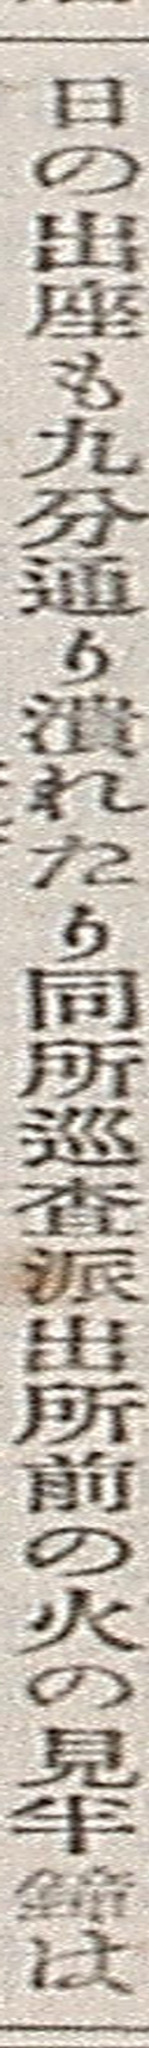日の出座も九分通り潰れたり同所巡査派出所前の火の見半鐘は
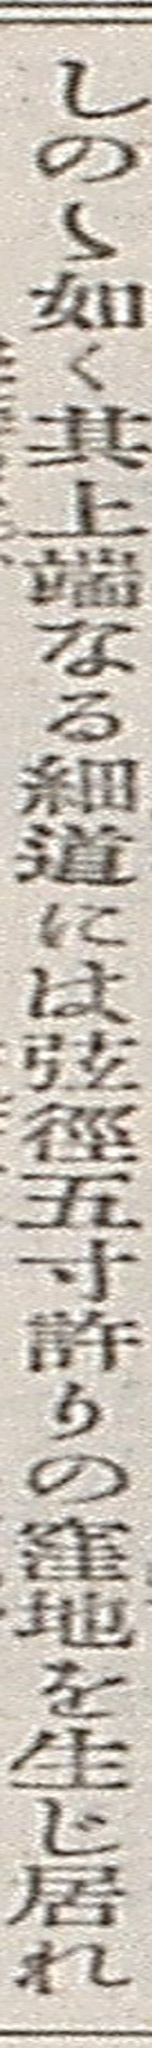しのゝ如く其上端なる細道には弦径五寸許りの窪地を生じ居れ
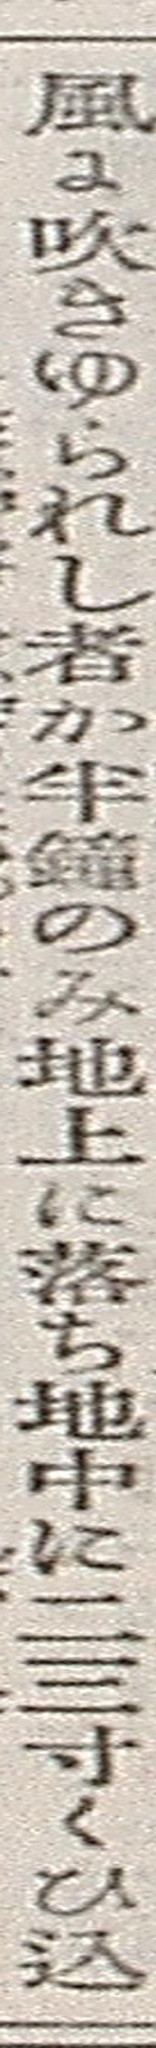風に吹きゆられし者か半鐘のみ地上に落ち地中に二三寸くひ込
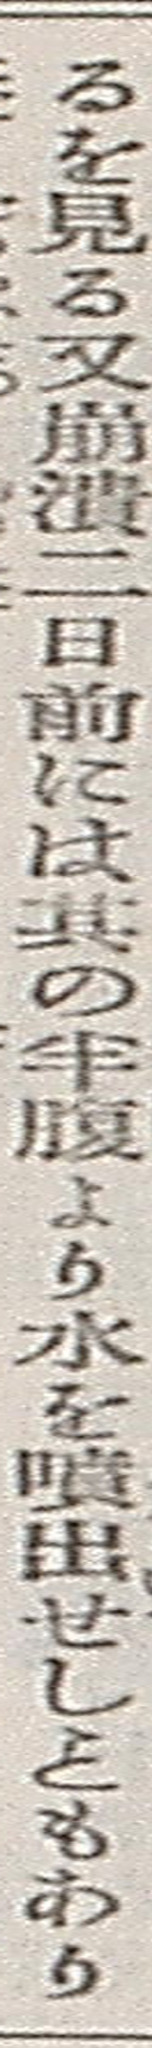るを見る又崩潰二日前には其の半腹より水の吹出せしこともあり
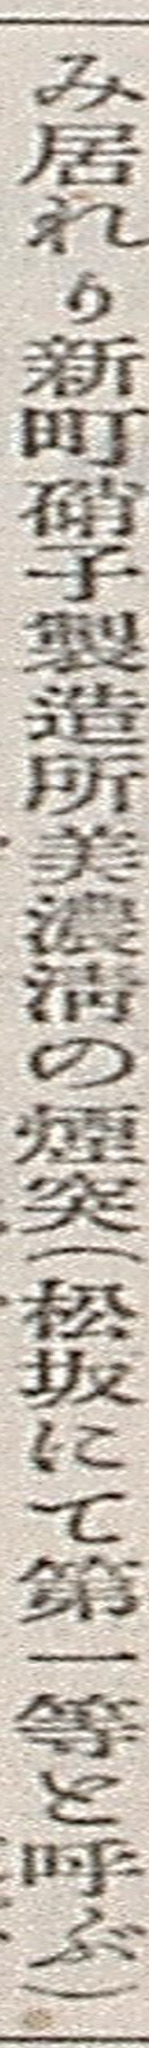み居たり新町硝子製造所美濃清の煙突一等と呼ぶ）
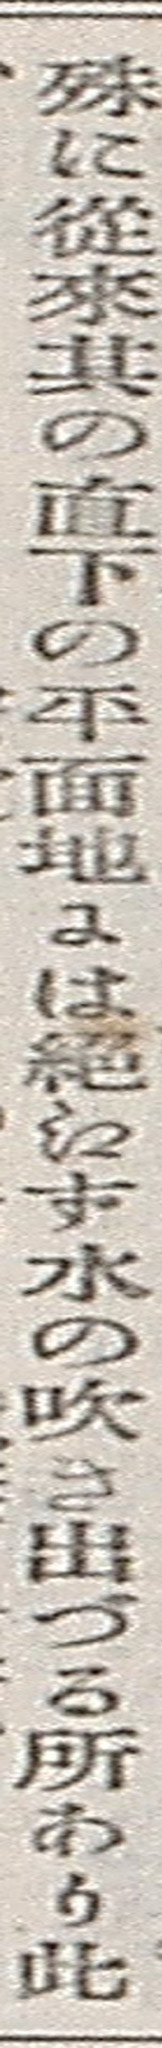殊に従来其の直下の平面地には絶えず水の吹き出づる所あり此
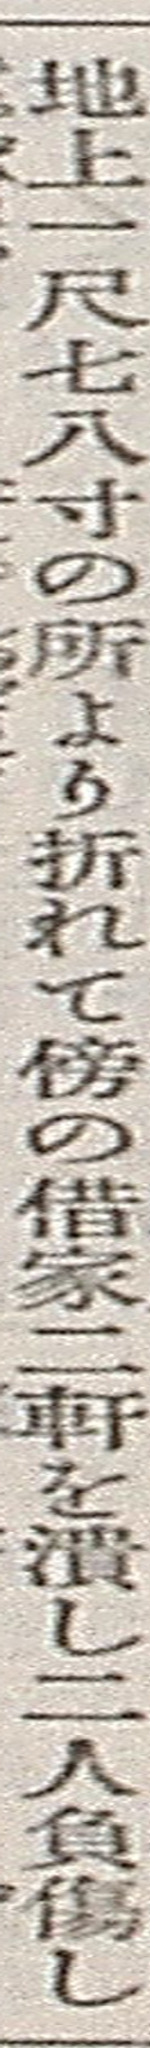地上一尺七八寸の所より折れて傍の借家二軒を潰し二人負傷し
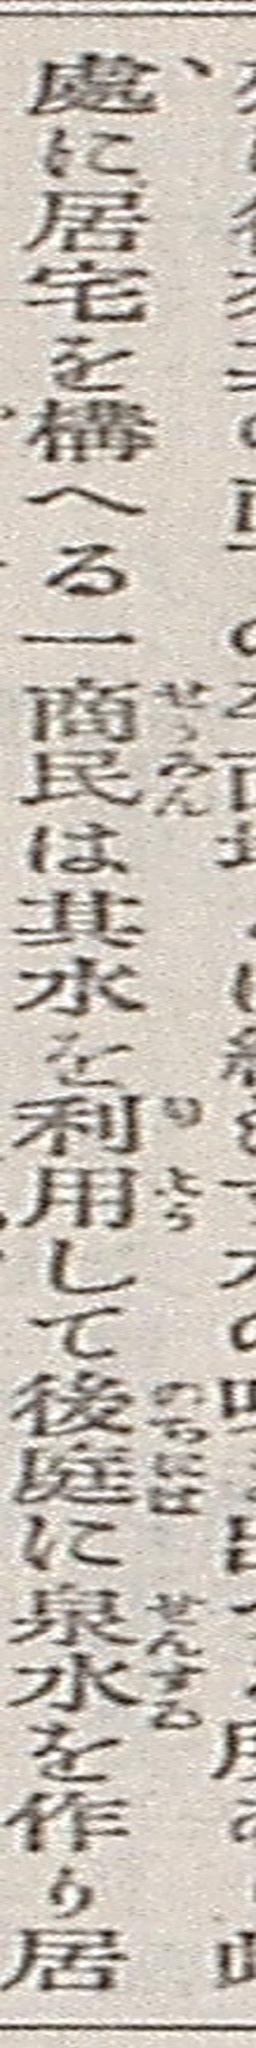処に居宅を構へる一商民は其水を利用して後庭に泉水を作り居
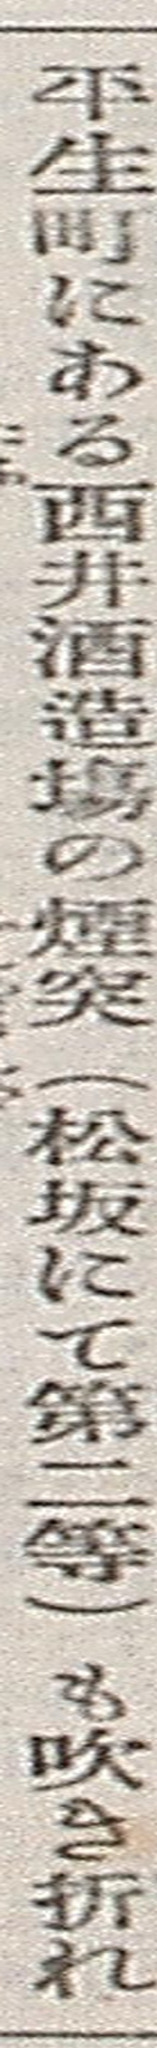平生町にある西井酒造場の煙突二等）も吹き折れ
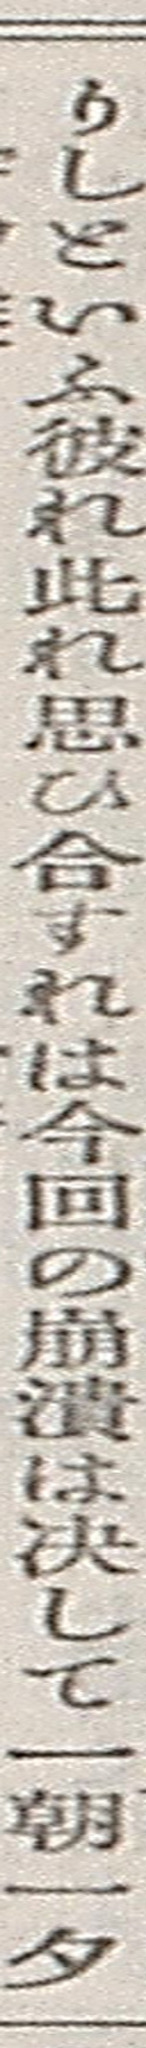りしといふ彼れ此れ思ひ合すれは今回の崩潰は决して一朝一夕
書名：風俗畫報臨時増刊第百二十八號　洪水被害録（下）
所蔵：東京大学地震研究所図書室 Earthquake Research Institute Library, The University of Tokyo, JAPAN
